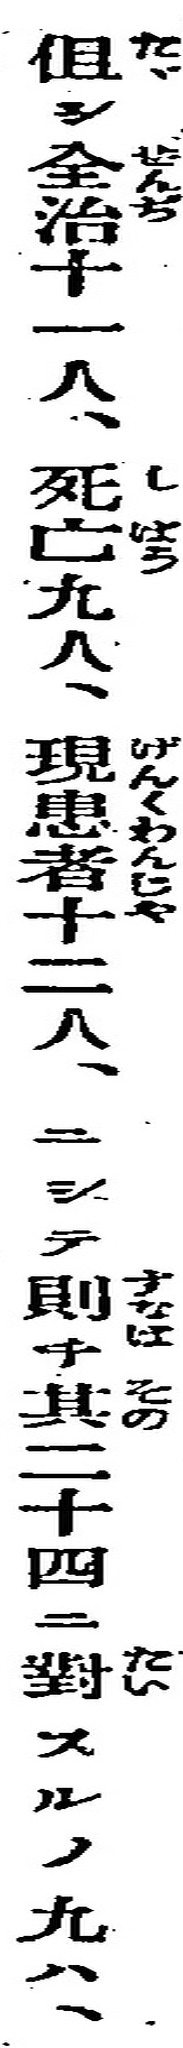伹シ全治十一人、死亡九人、現患者十二人、ニシテ則チ其二十四ニ対スルノ九ハ、
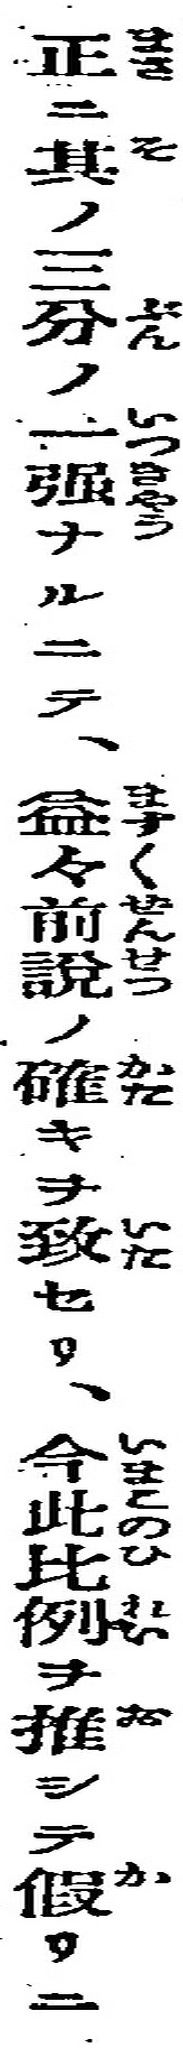正ニ其ノ三分ノ一強ナルニテ、益々前説ノ確キヲ致セリ、今此比例ヲ推シテ仮リニ
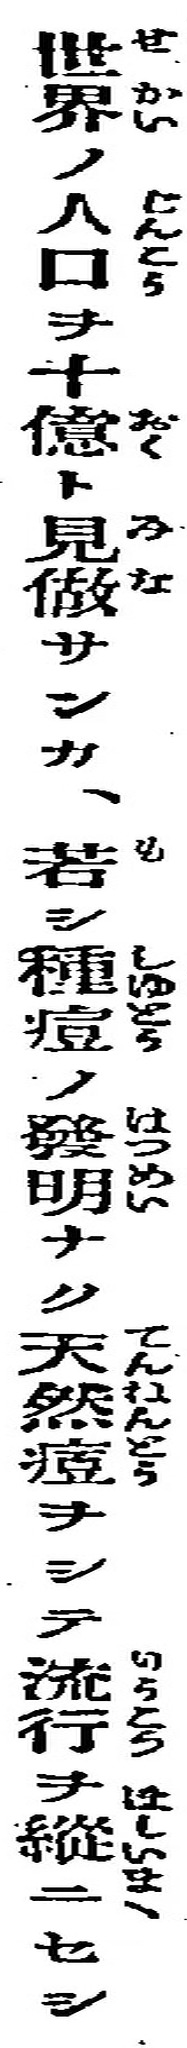世界ノ人口ヲ十億ト見做サンカ、若シ種痘ノ発明ナク天然痘ヲシテ流行ヲ緃ニセシ
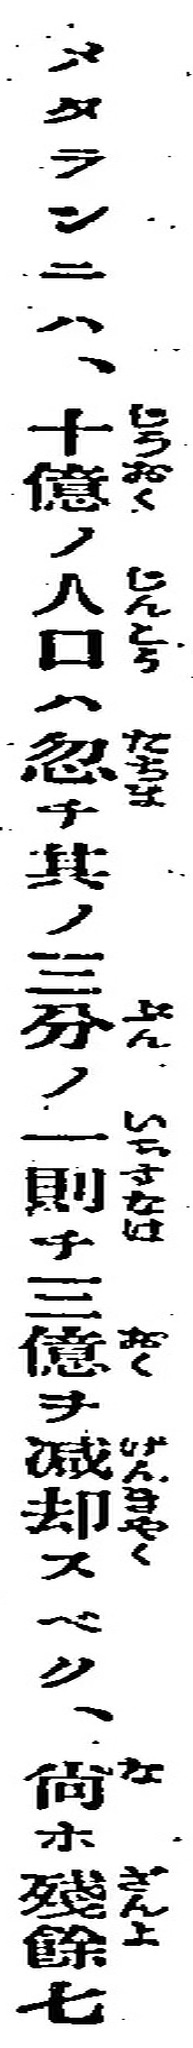メタランニハ、十億ノ人口ハ忽チ其ノ三分ノ一則チ三億ヲ減却スベク、尚ホ残余七
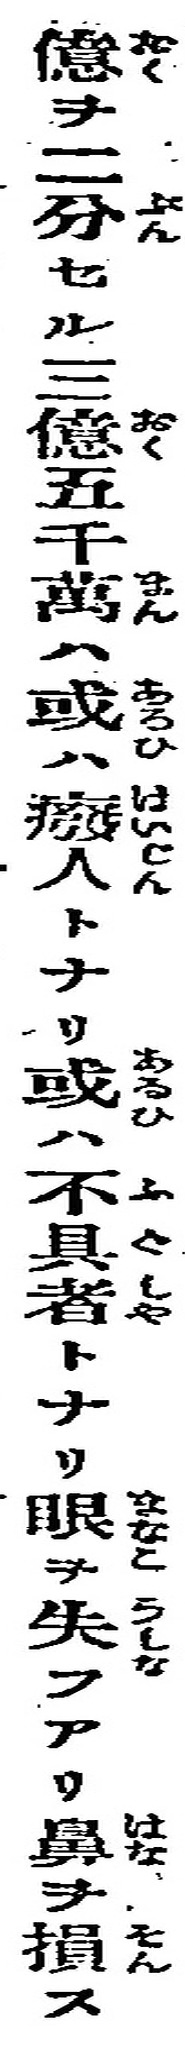億ヲ二分セル三億五千万ハ或ハ廃人トナリ或ハ不具者トナリ眼ヲ失フアリ鼻ヲ損ス
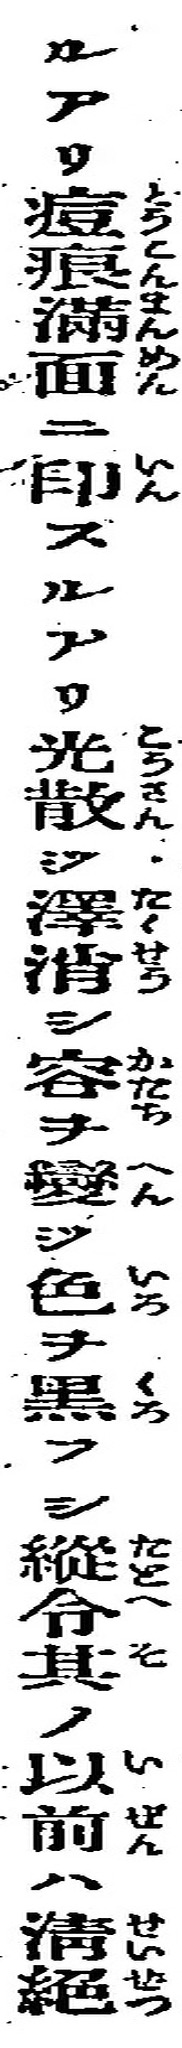ルアリ痘痕満面に印スルアリ光散ジ沢消シ容ヲ変ジ色ヲ黒フシ緃令其ノ以前ハ清絶
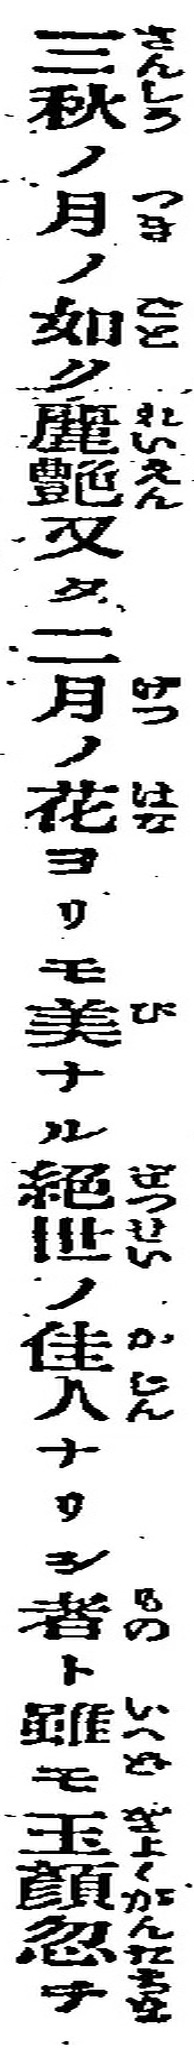三秋ノ月ノ如ク麗艶又タ二月ノ花ヨリモ美ナル絶世ノ佳人ナリシ者ト雖モ玉顔忽チ
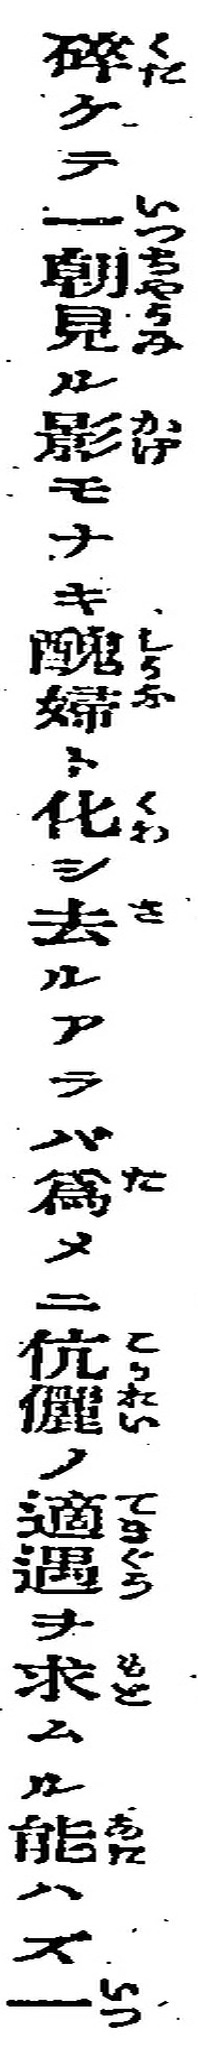砕ケテ一朝見ル影モナキ醜婦ト化シ去ルアラバ為メニ伉儷ノ適遇ヲ求ムル能ハズ一
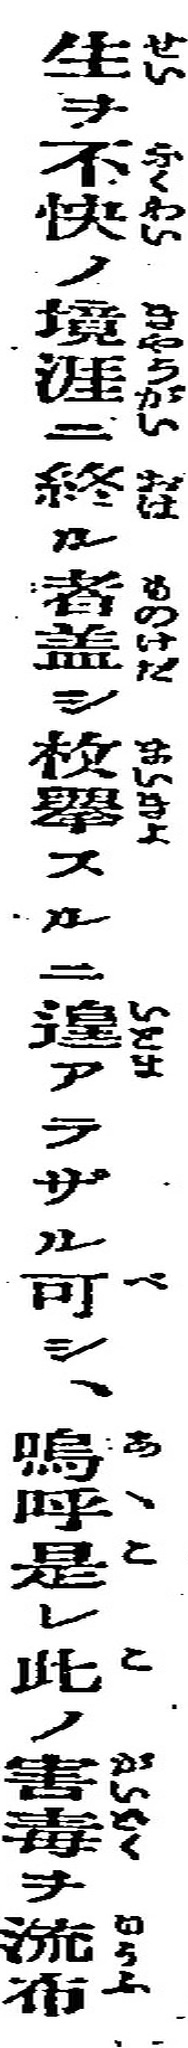生ヲ不快ノ境涯ニ終ル者蓋シ枚挙スルニ遑アラザル可シ、嗚呼是レ此ノ害毒ヲ流布
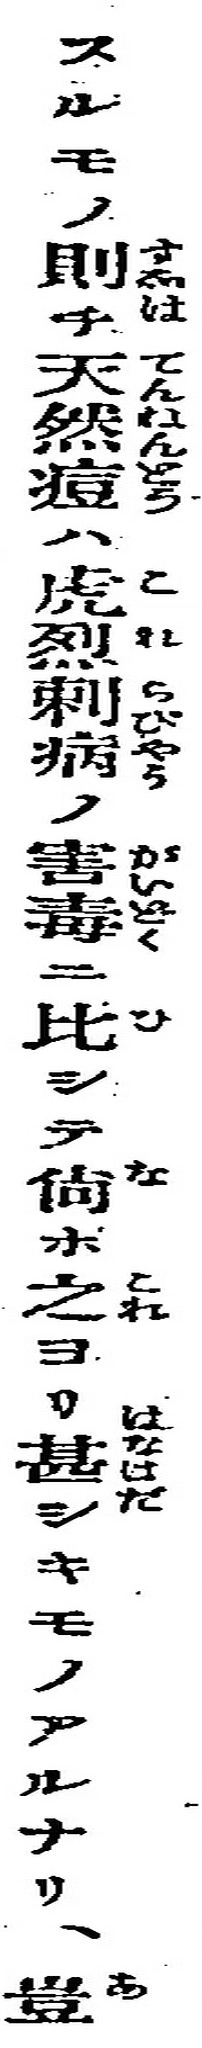スルモノ則チ天然痘ハ虎烈刺病ノ害毒ニ比シテ尚ホ之ヨリ甚シキモノアルナリ、豈
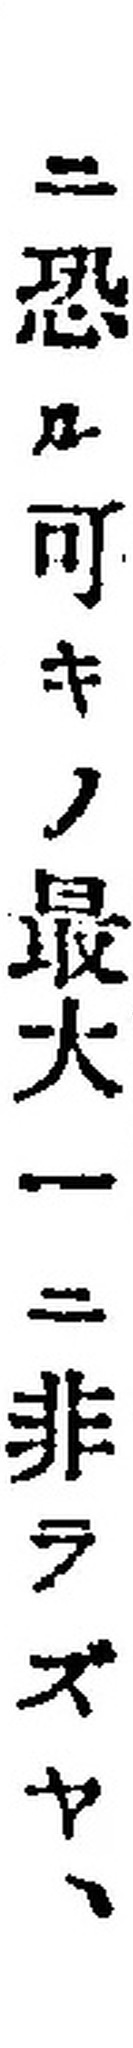ニ恐ル可キノ最大一ニ非ラズヤ、
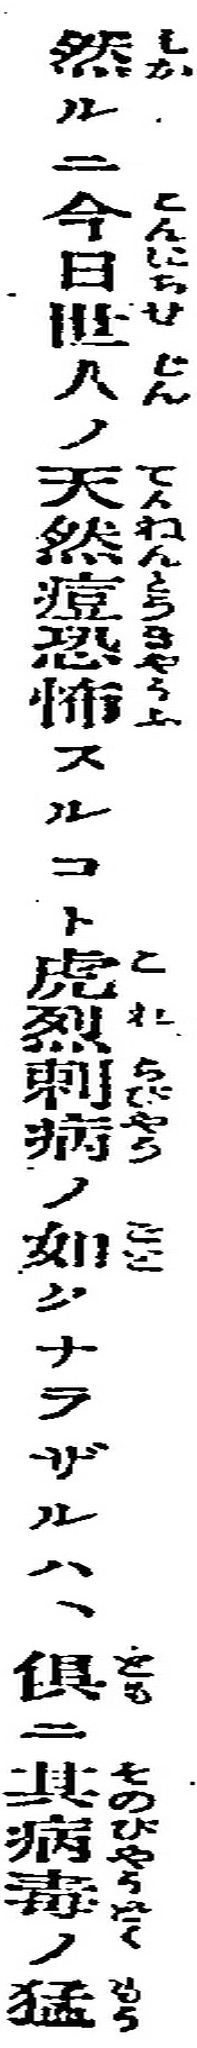然ルニ今日世人ノ天然痘恐怖スルコト虎烈刺病ノ如クナラザルハ、倶ニ其病毒ノ猛
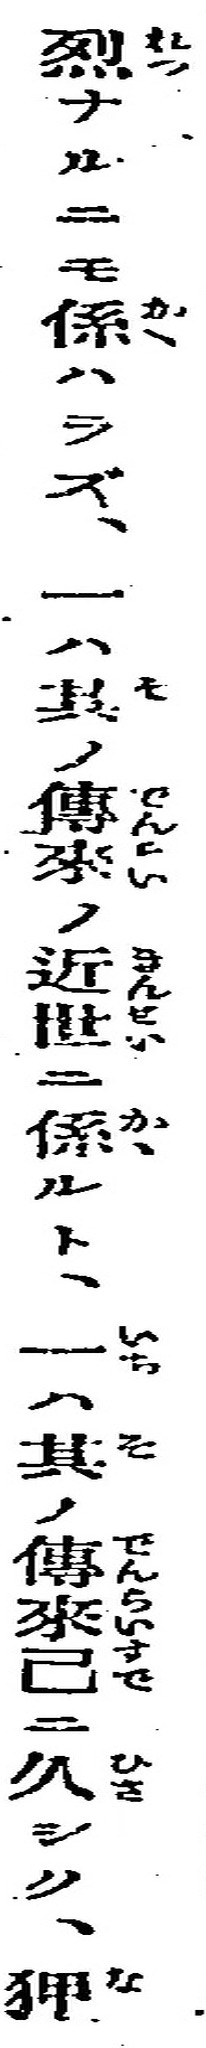烈ナルニモ係ハラズ、一ハ其ノ伝来ノ近世ニ係ルト、一ハ其ノ伝来己ニ久シク、狎
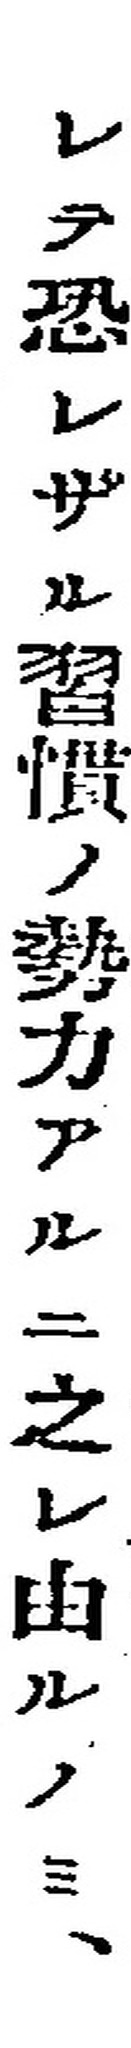レテ恐レザル習慣ノ勢力アルニ之レ由ルノミ、
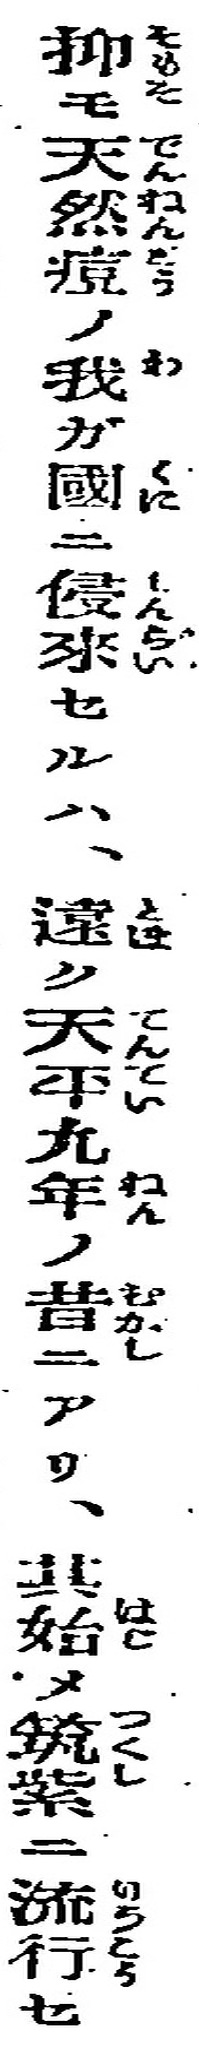抑モ天然痘ノ我ガ国ニ侵来セルハ、遠ク天平九年ノ昔ニアリ、其始メ筑紫ニ流行セ
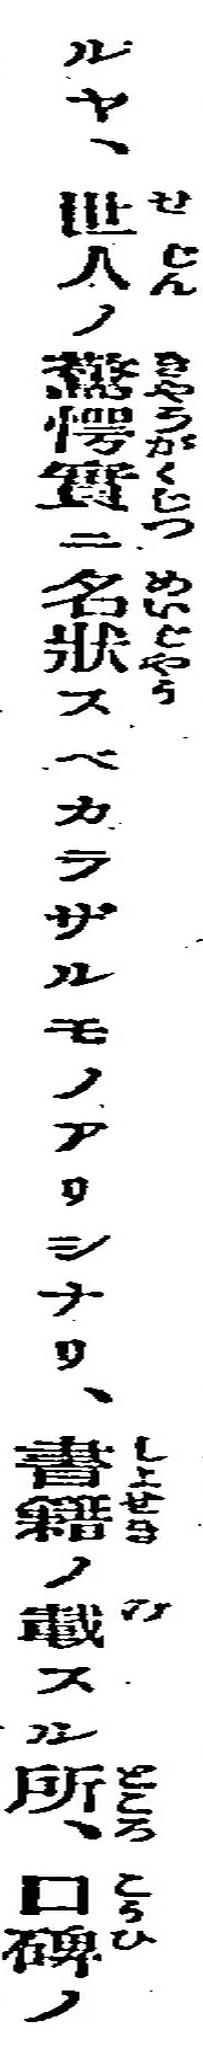ルヤ、世人ノ驚愕実ニ名状スベカラザルモノアリシナリ、書籍ノ載スル所、口碑ノ
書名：天然痘予防注意兼種痘者之注意
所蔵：国立国会図書館 National Diet Library, JAPAN
